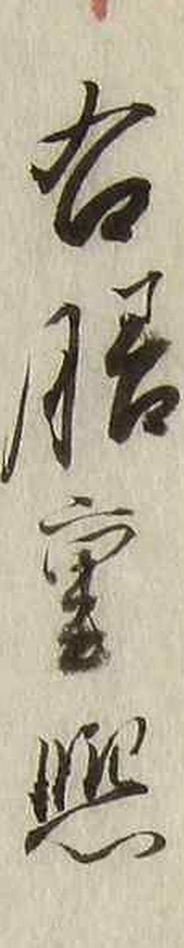右膳重熙
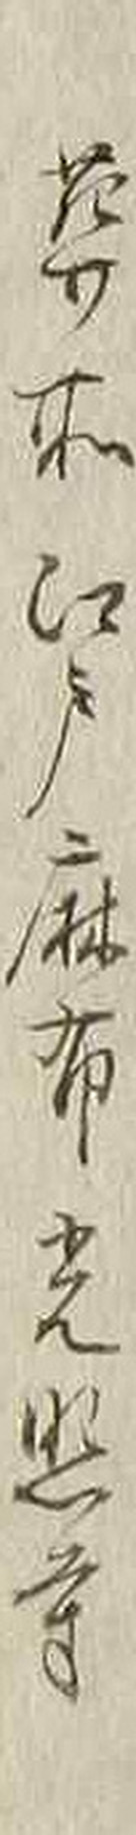葬所江戸麻布光熙寺
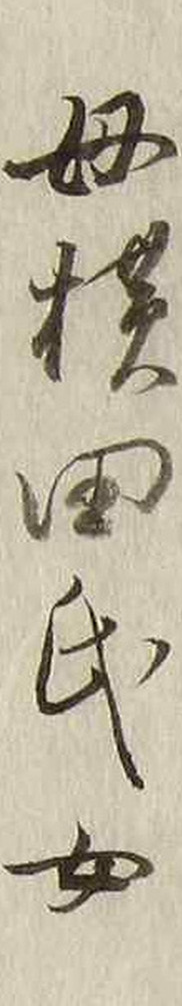母横田氏女

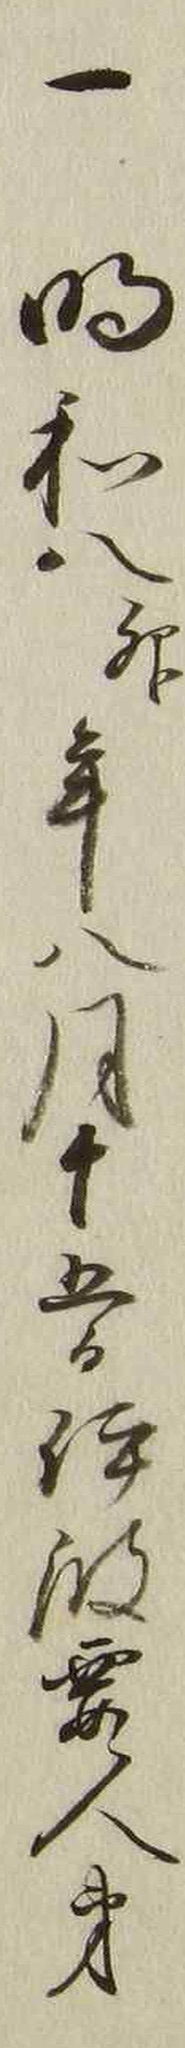一明和八卯年八月十五日伊波要人弟
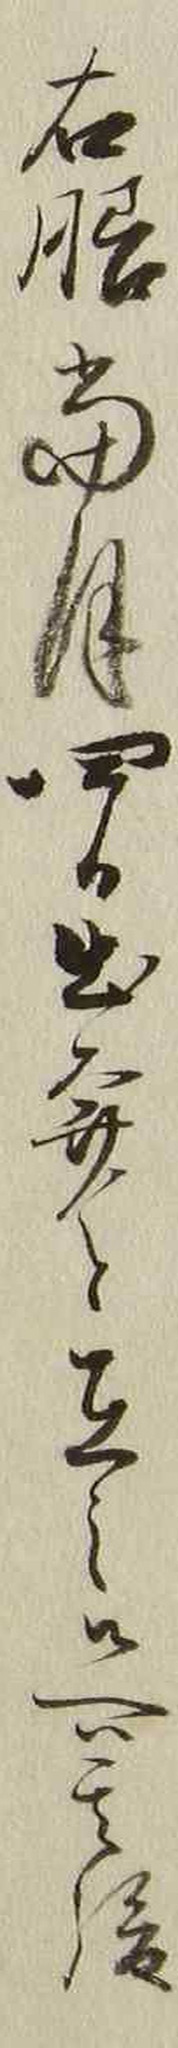右膳当月四日出奔とこれ在り候へハ其後
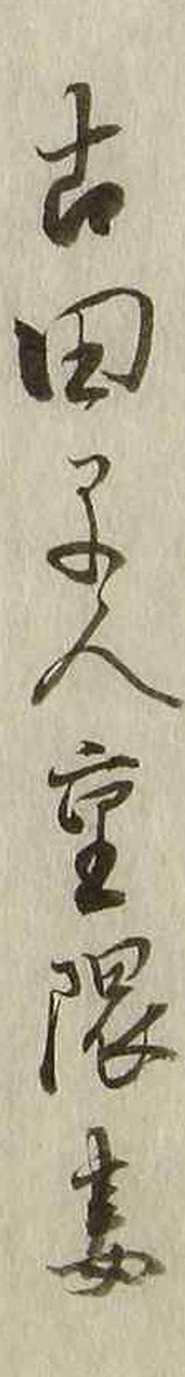女古田早人重隈妻
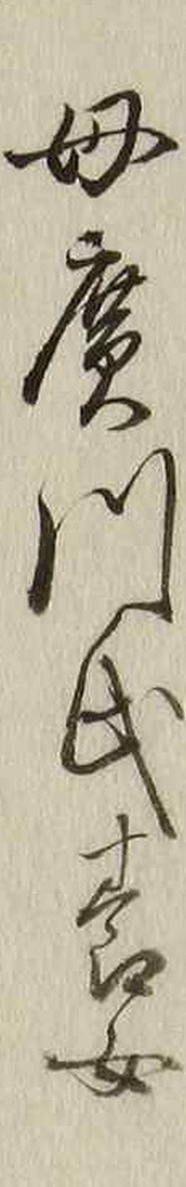母廣川氏養女
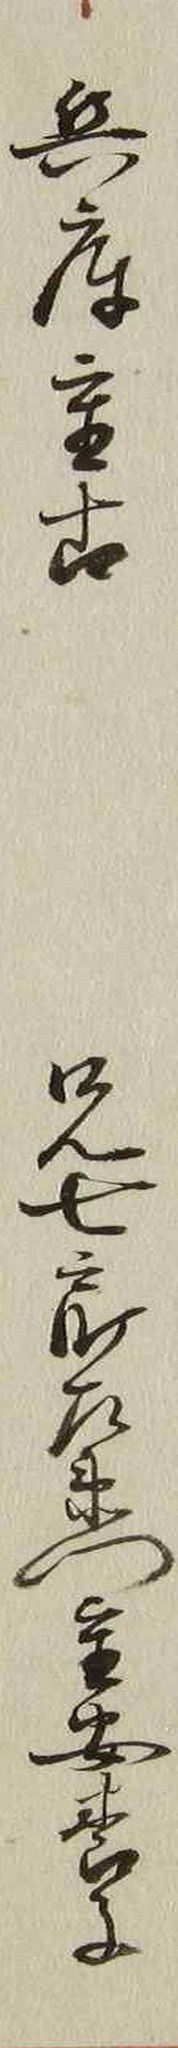兵庫重古兄七郎左衛門重安養子
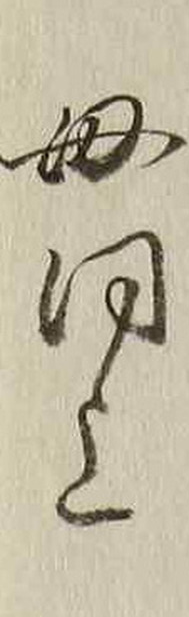母同上
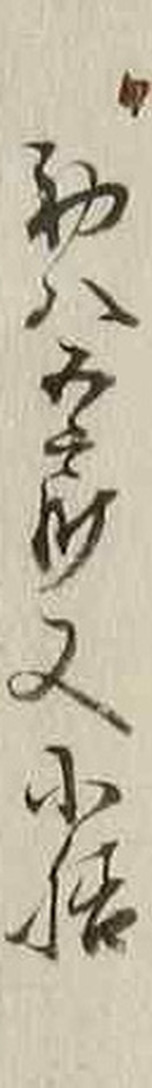初八五郎又小膳
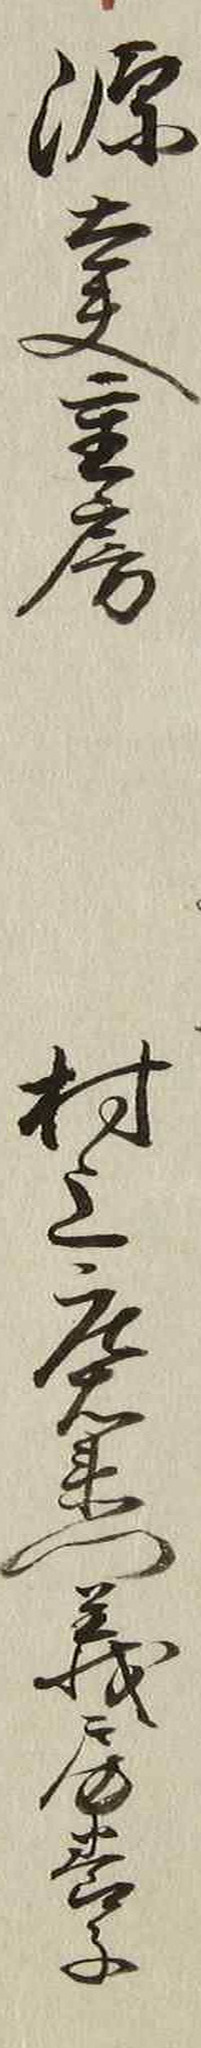源太夫重房村上庄右衛門義房養子
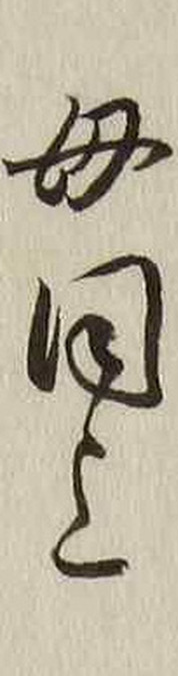母同上
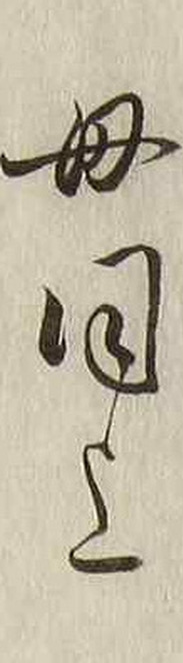母同上
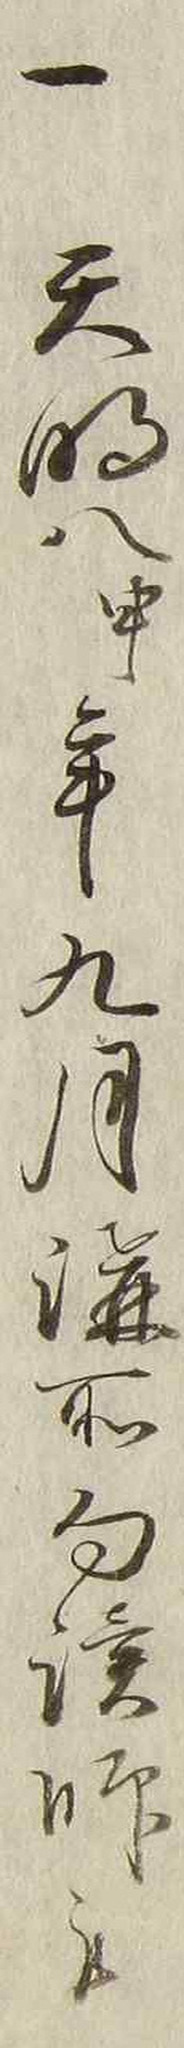一天明八申年九月講所句読師

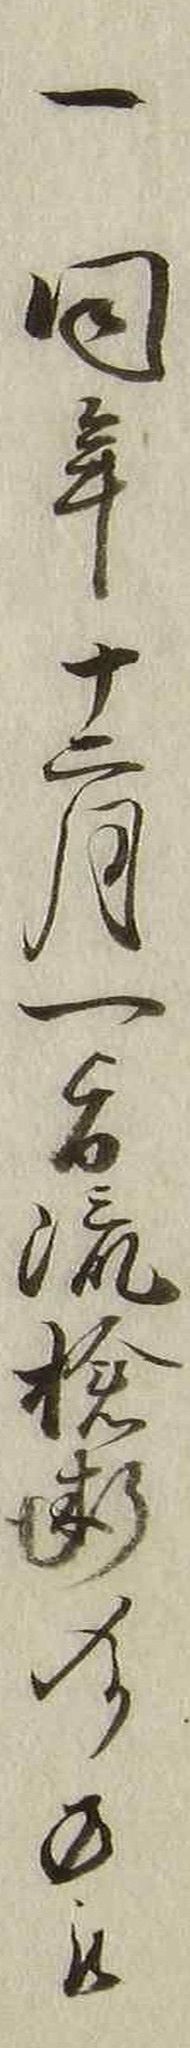一同年十二月一旨流槍術〆り方
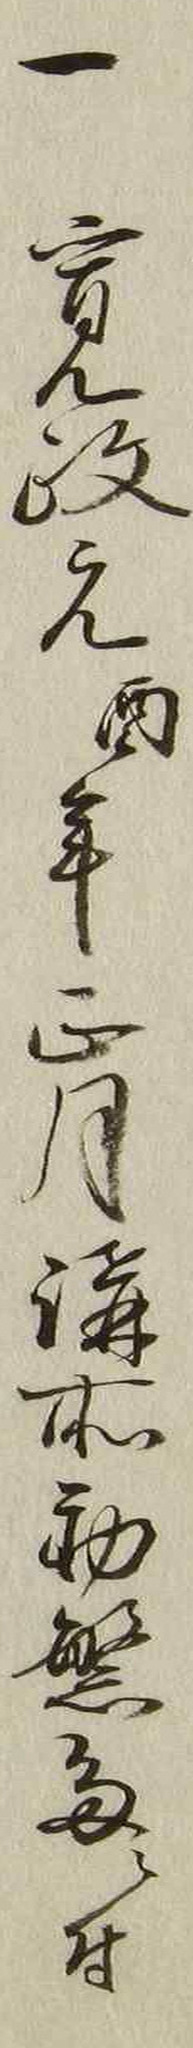一寛政元酉年正月講所勤め繁多ニ付き
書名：諸士系譜　巻之20　い之部20
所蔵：会津若松市立会津図書館
